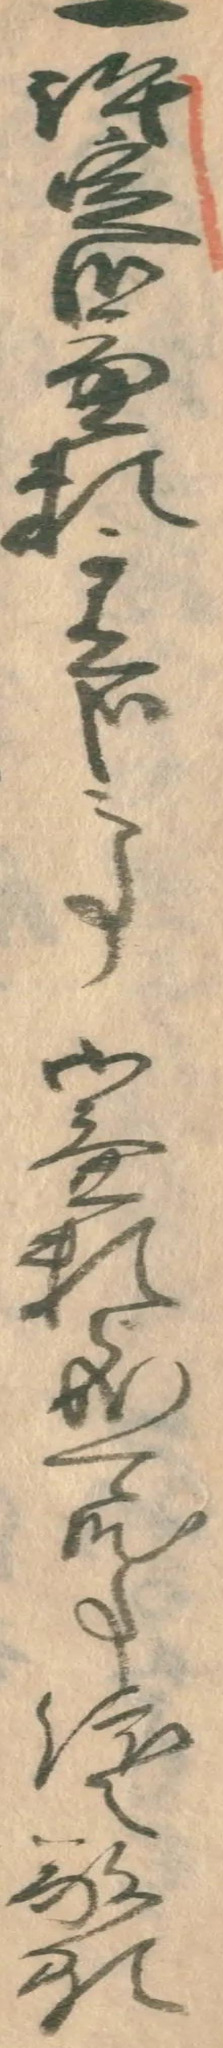一評定御兼頼可有哉之事御兼頼被成可被然事依之敬顕
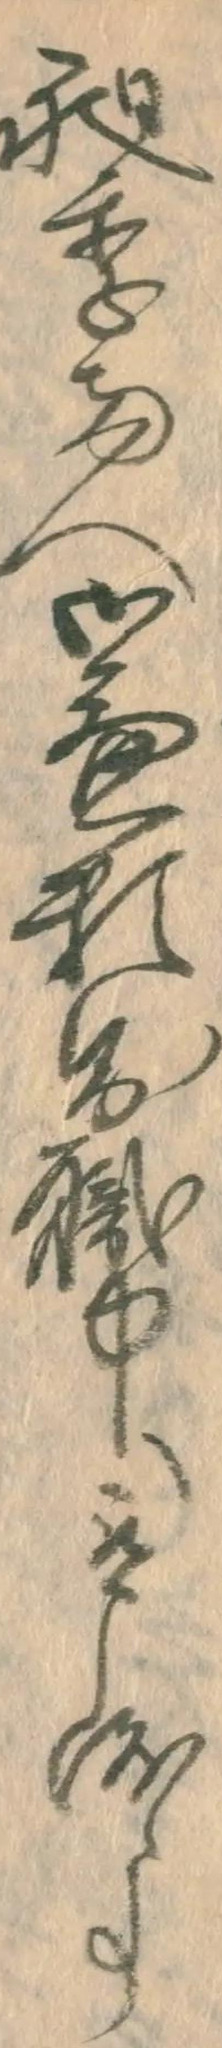昶季両人御兼頼則職中へ被申渡候事
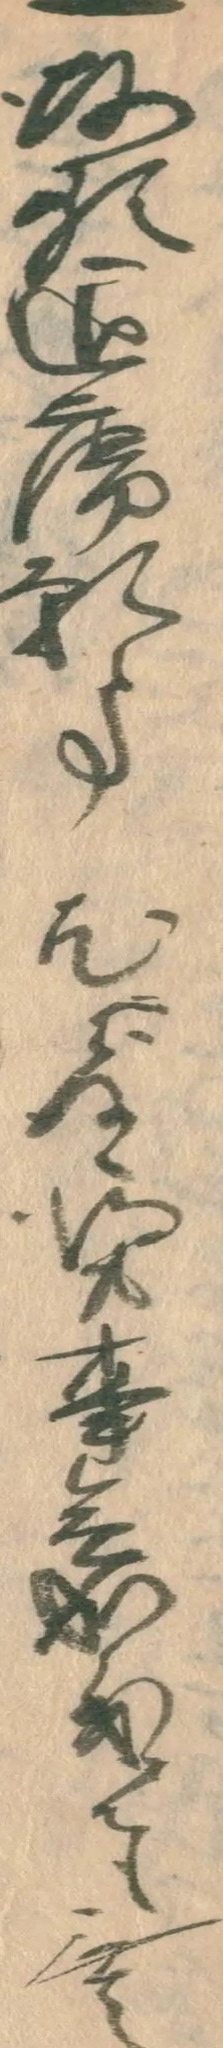一存顕退席願候事尤被存候得共事急成義ニても無之
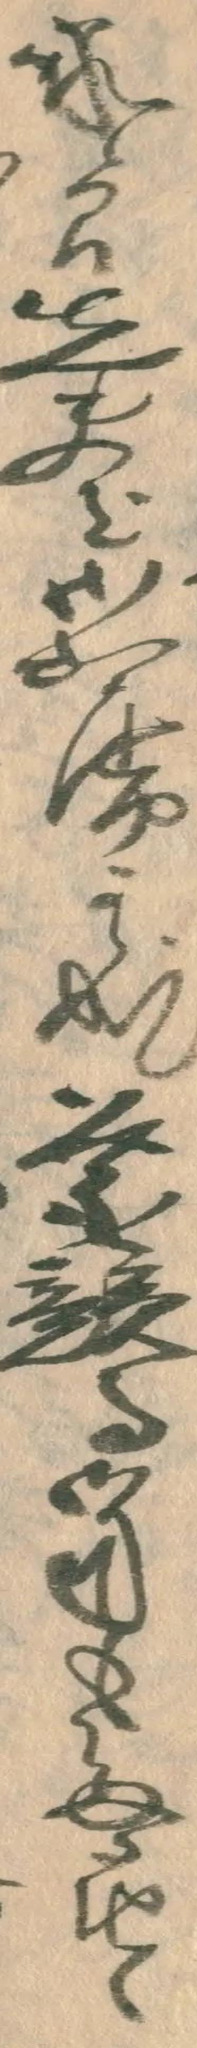承候間先夫迄御出席可被成候葵競馬御用も多御座候
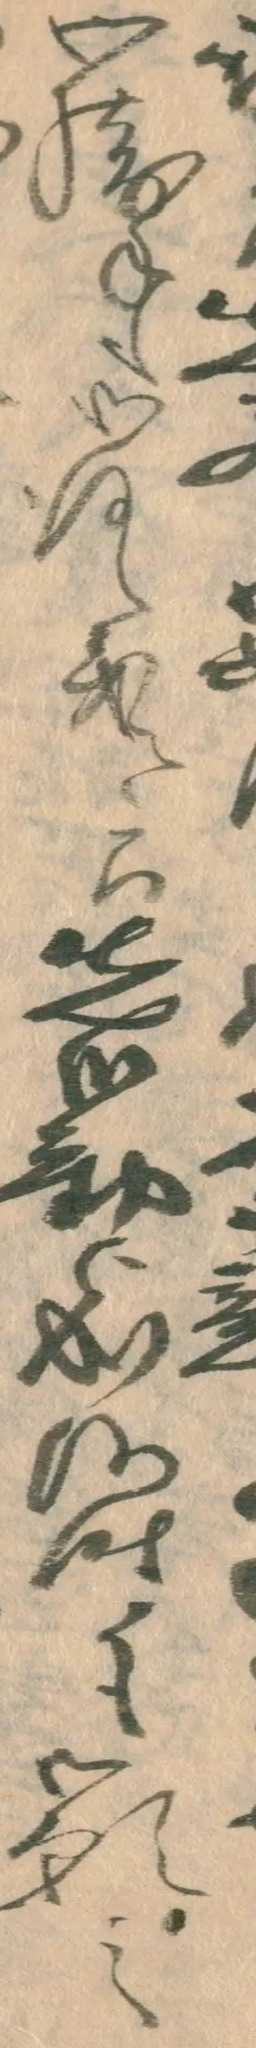御勝手も御存候義ニ候間先御勤被成何時ニても御願之
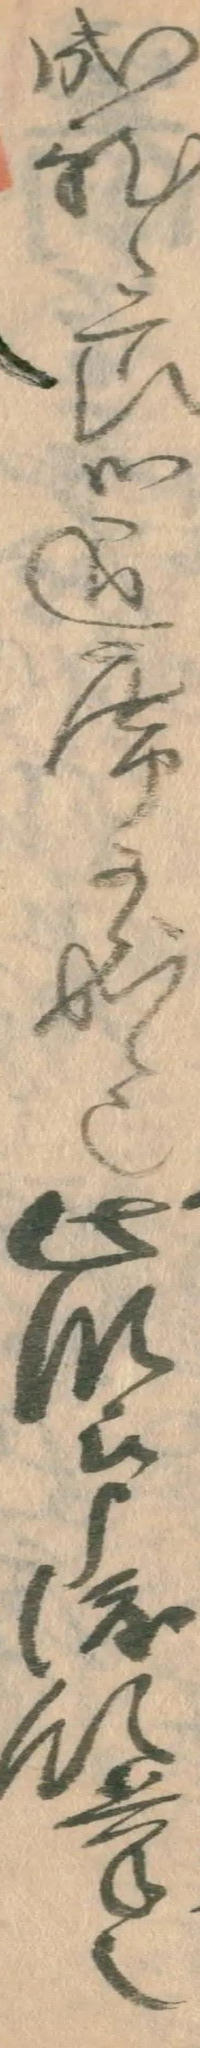成就之節御退席可被成候也此段被申渡領掌也
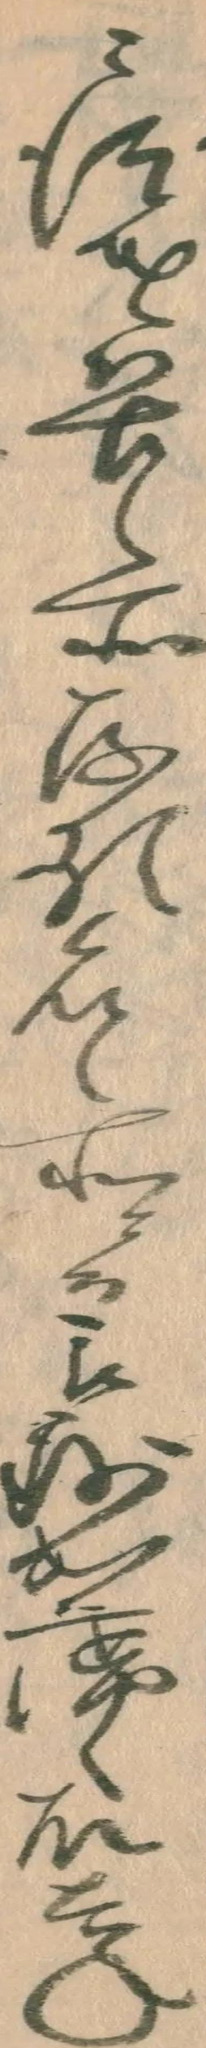被仰出候筈之所存顕之所ニ而被致出席候故去年
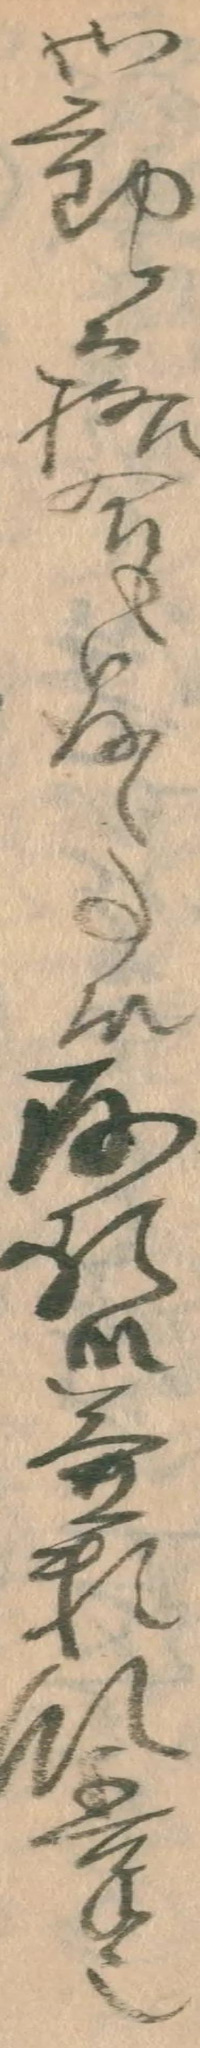御勤ニ而格合も御存候事故存顕御兼頼領掌也
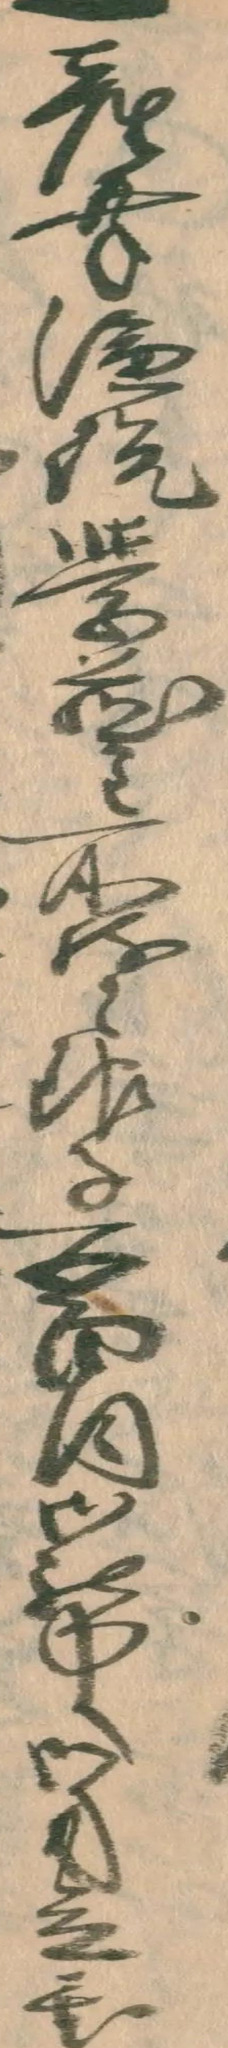一産幸演説学蔵主所持之銀子五百目御社中へ御用立置
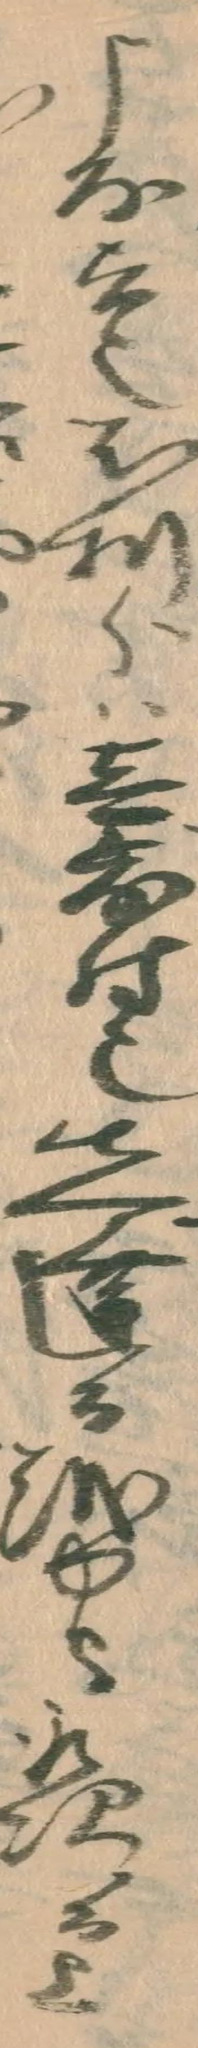申度旨也尤利分ハ壱歩付也先達而越中守取次ニ而上
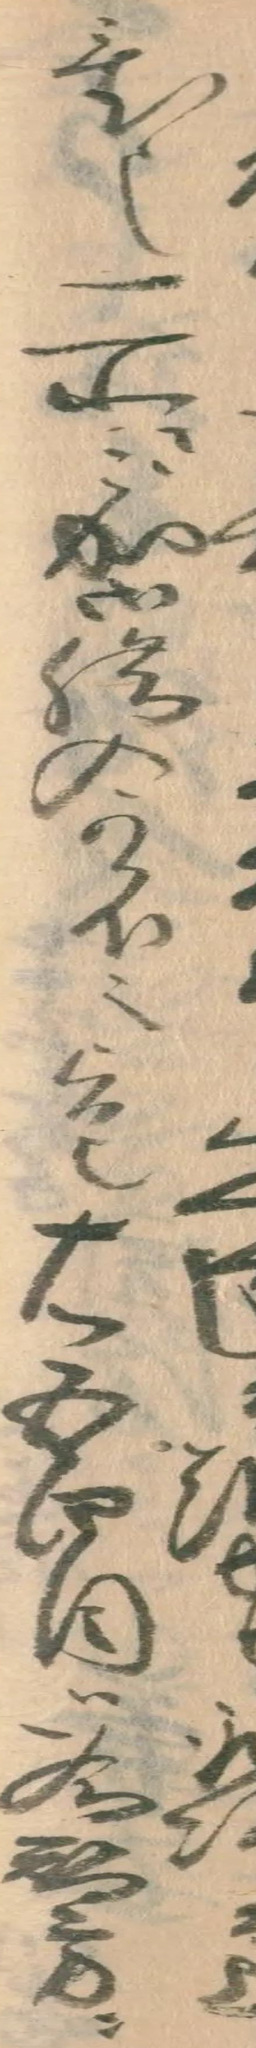置申候一所ニ被成御借入可被下之旨也右五百目ハ為替方ニ
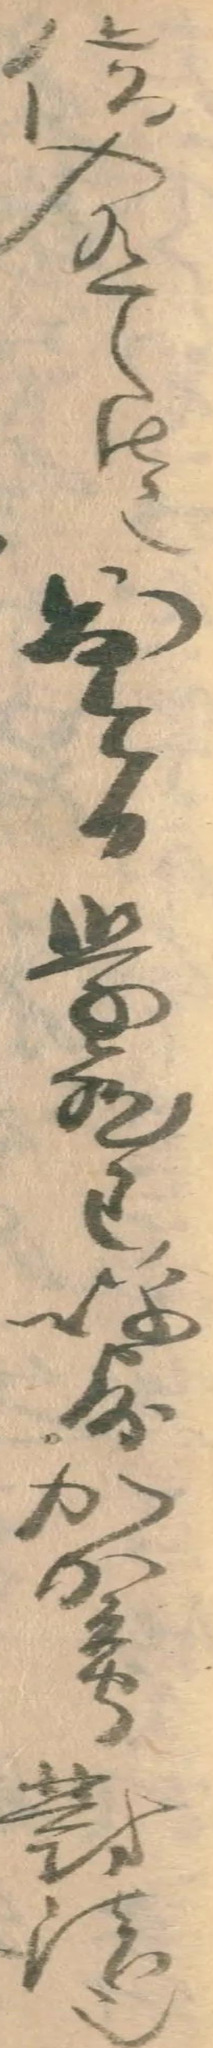借入有之由也則今日学蔵主呼寄加賀守対請也
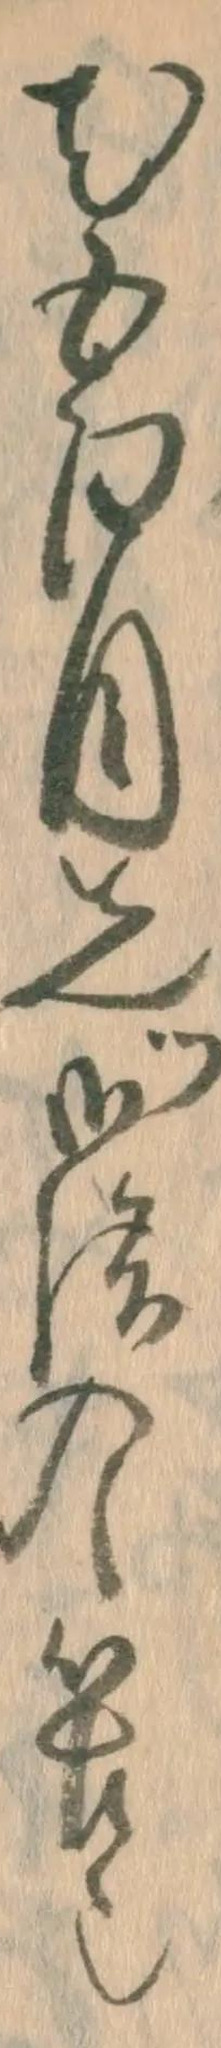尤五百目先ツ御借入候筈也
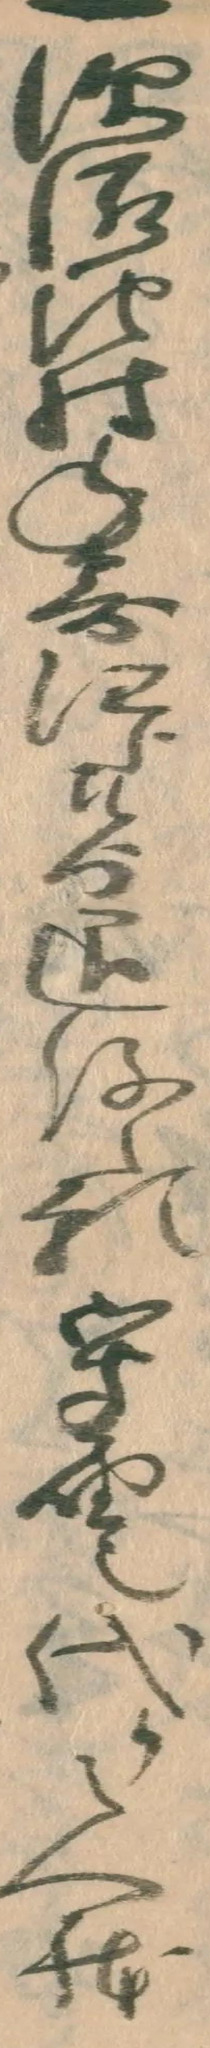一深泥池村年寄四郎左衛門退役之願御聞届也代り之人体
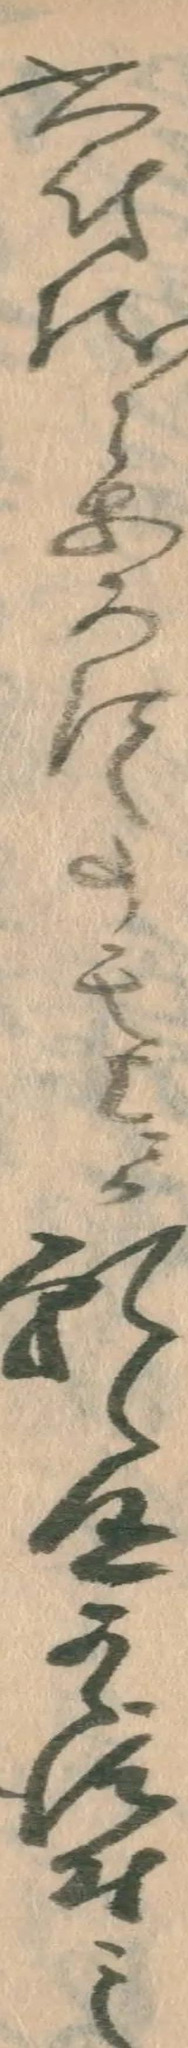書付役之安右衛門仕候事其上ニ而願之通可被仰付也
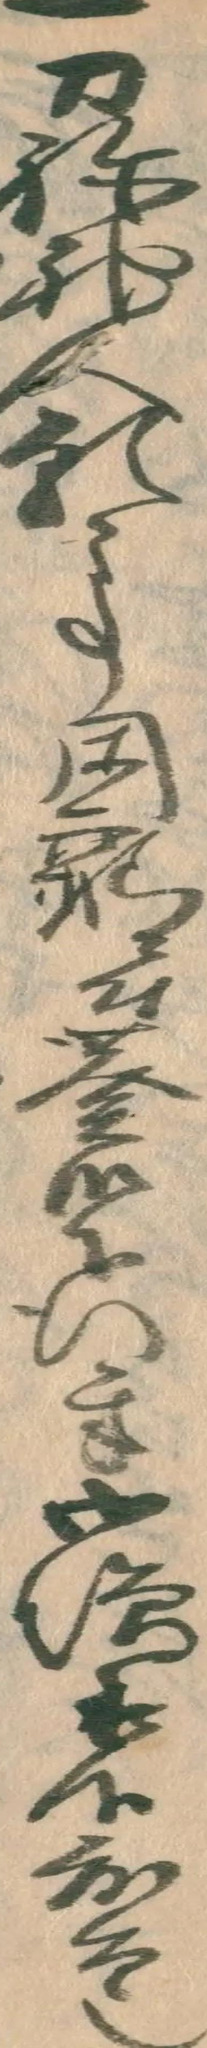一刀祢神人頼之事困窮ニ付葵御下行米御増被下度旨也
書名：賀茂社記録. 第60冊
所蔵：国立国会図書館 National Diet Library, JAPAN
